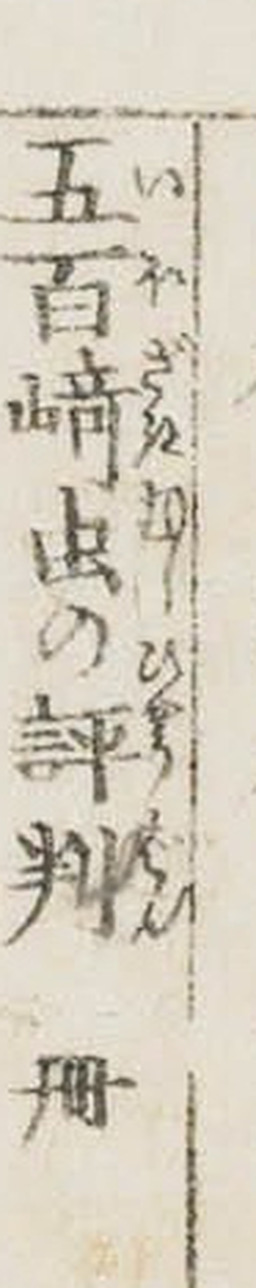五百崎虫の評判冊
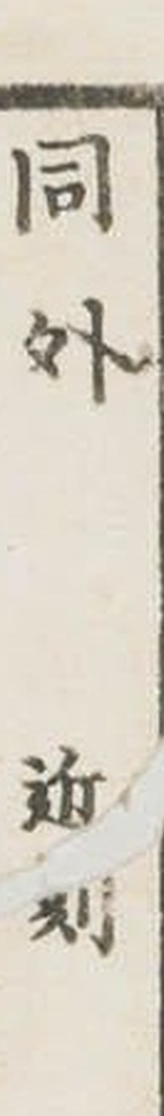同外近刻
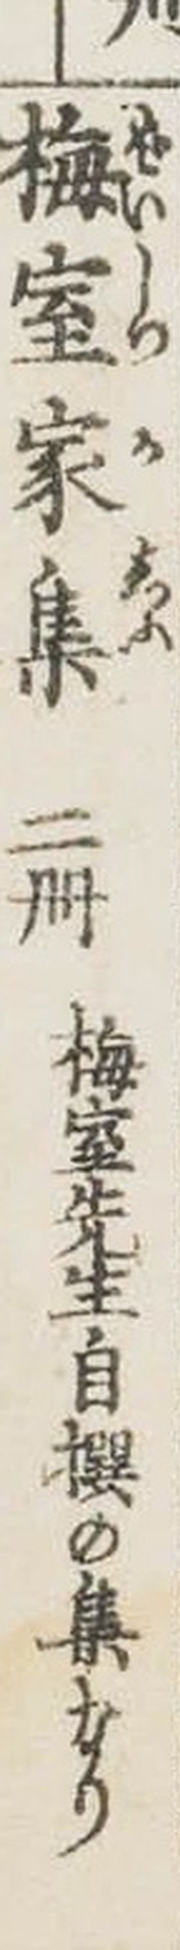梅室家集二冊梅室先生自撰の集なり
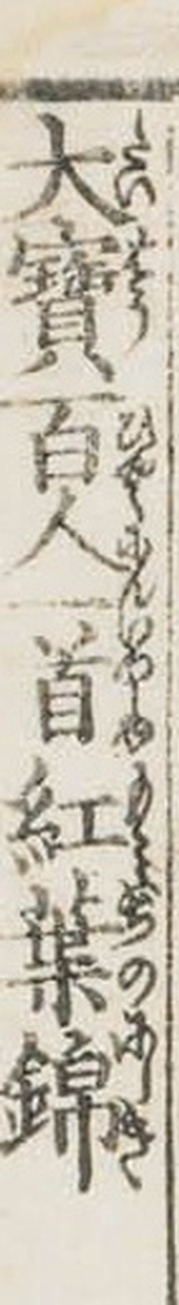大宝百人一首紅葉錦同
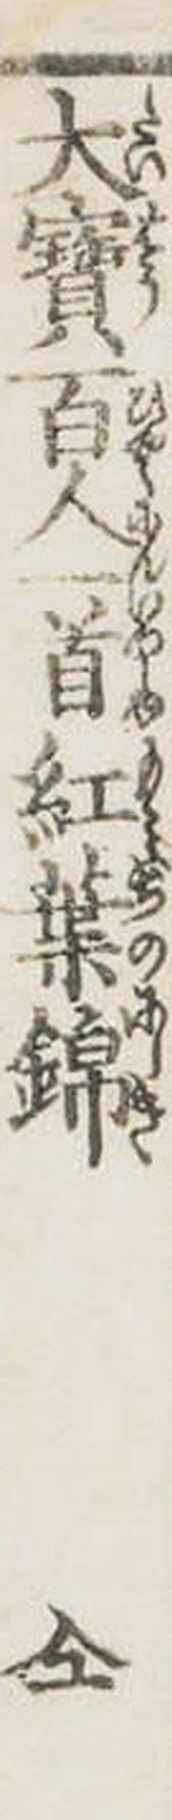大宝百人一首紅葉錦同
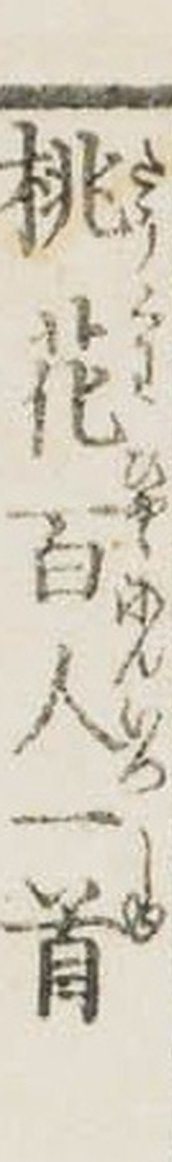桃花百人一首同
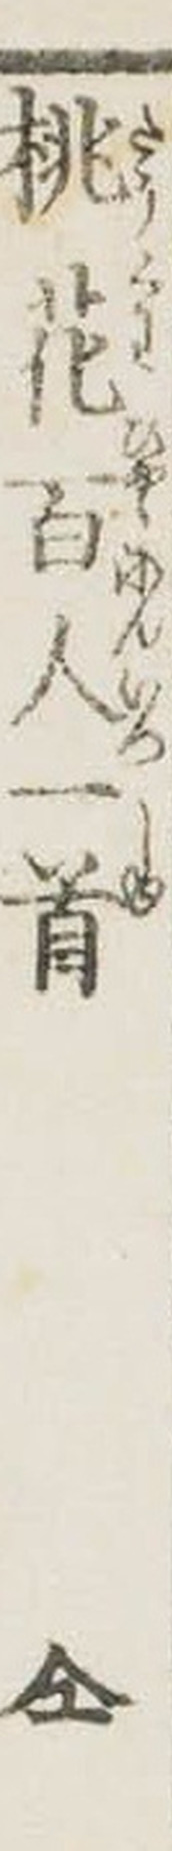桃花百人一首同
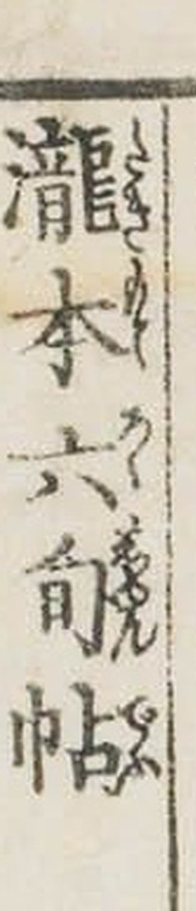瀧本六旬同
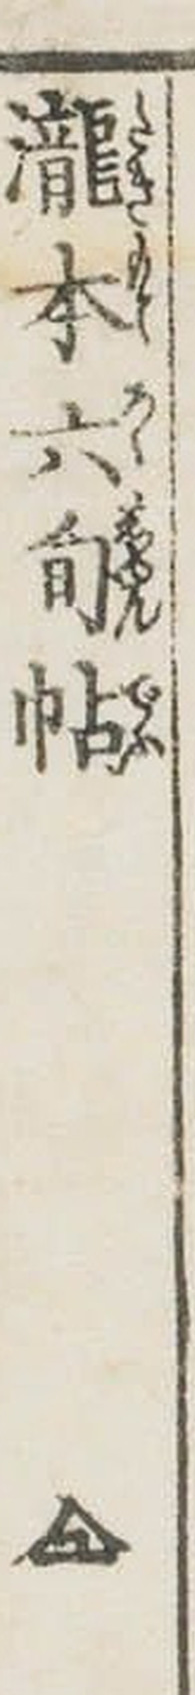瀧本六旬同
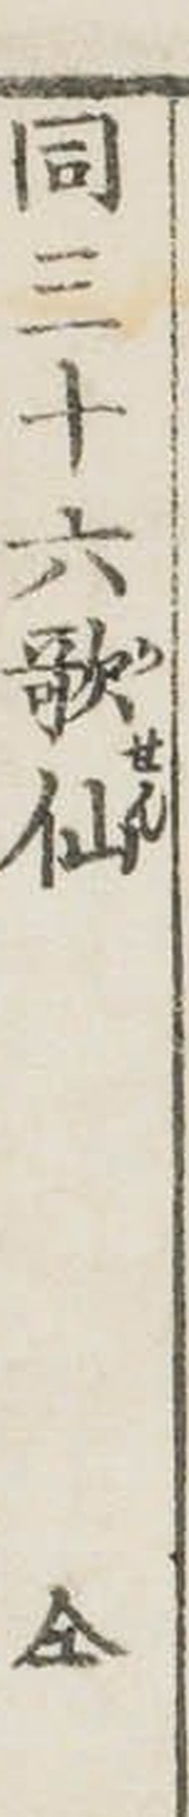同三十六歌仙同
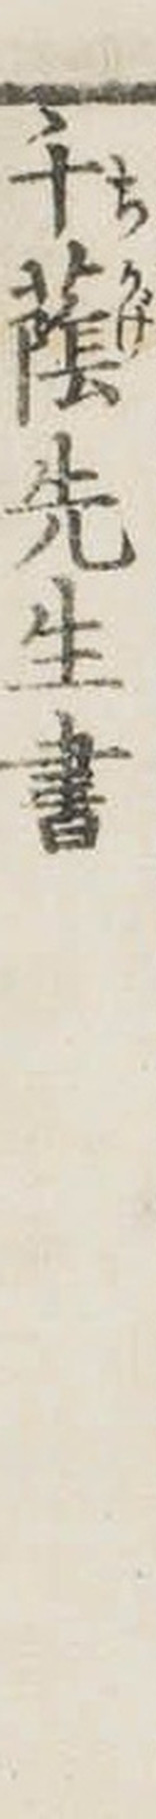千蔭先生書
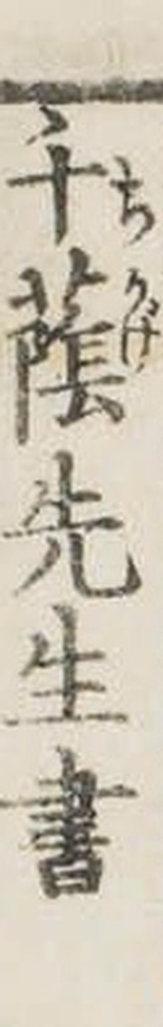千蔭先生書
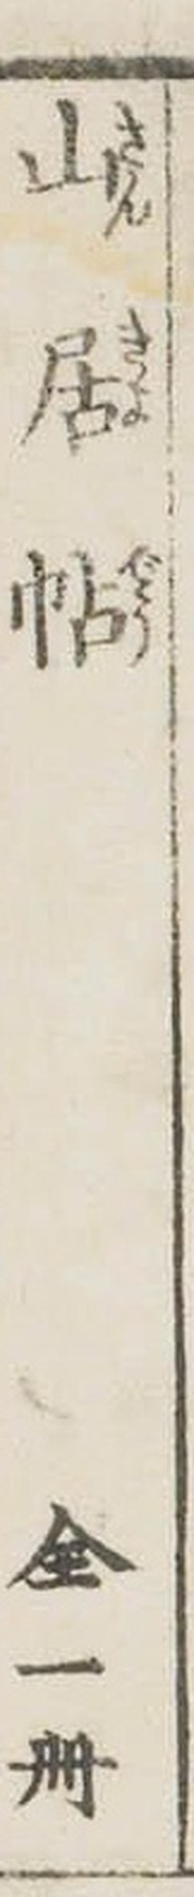山居帖全一冊
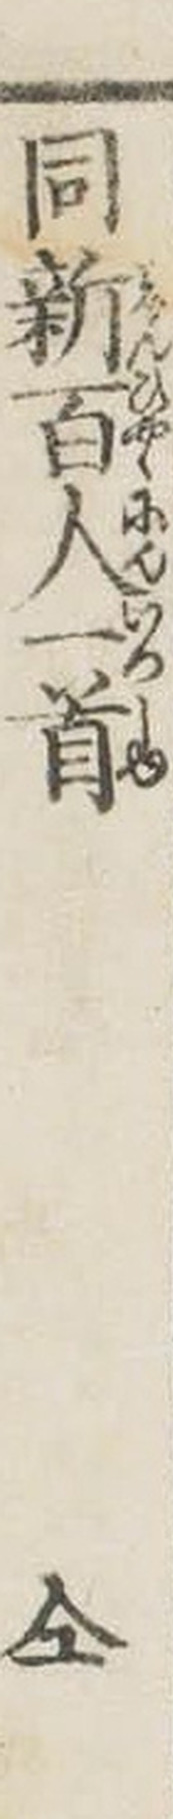同新百人一首同
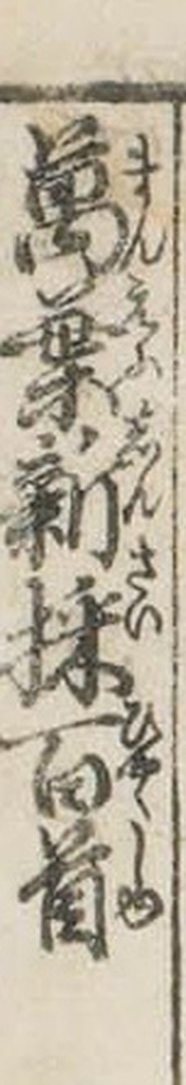万葉新採百首同
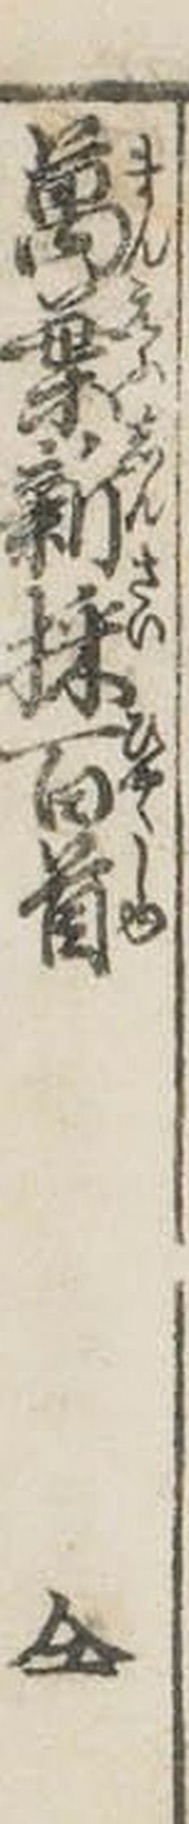万葉新採百首同
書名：源氏百人一首
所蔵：東京学芸大学教育コンテンツアーカイブ
